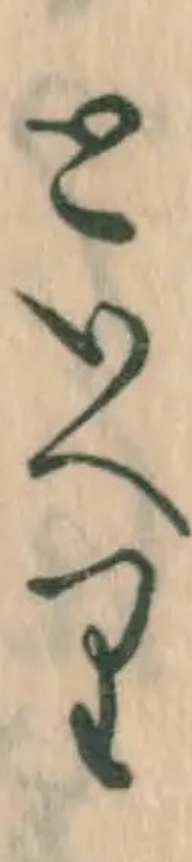といへり
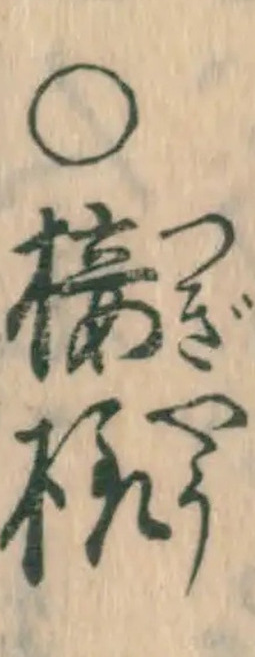○接様
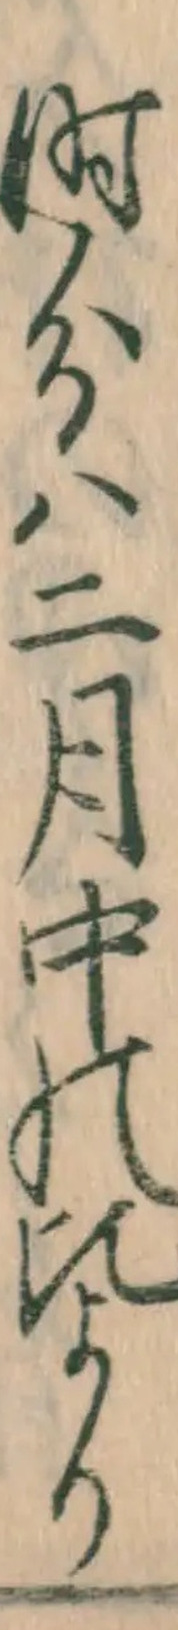時分は二月中の頃より
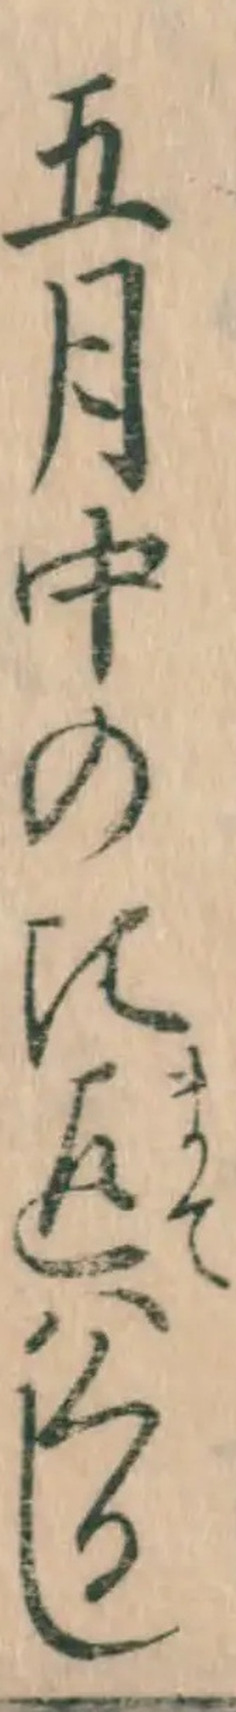五月中の頃迄はくるし
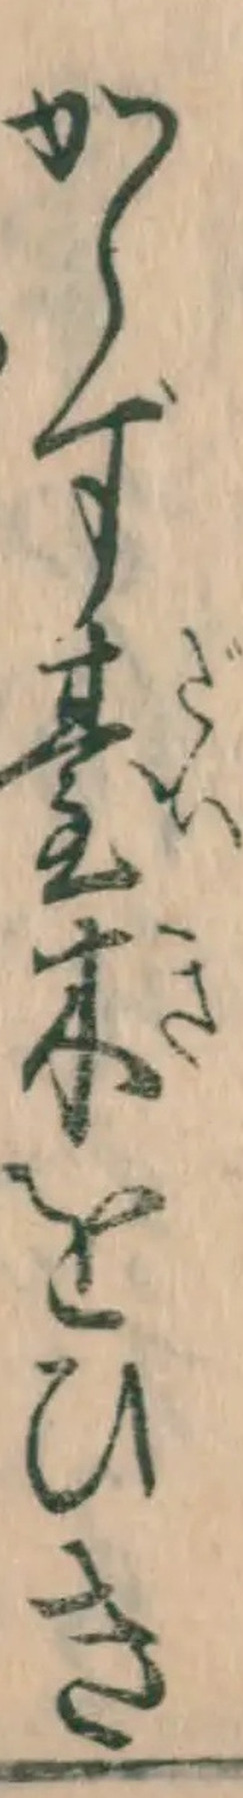からず䑓木をひき
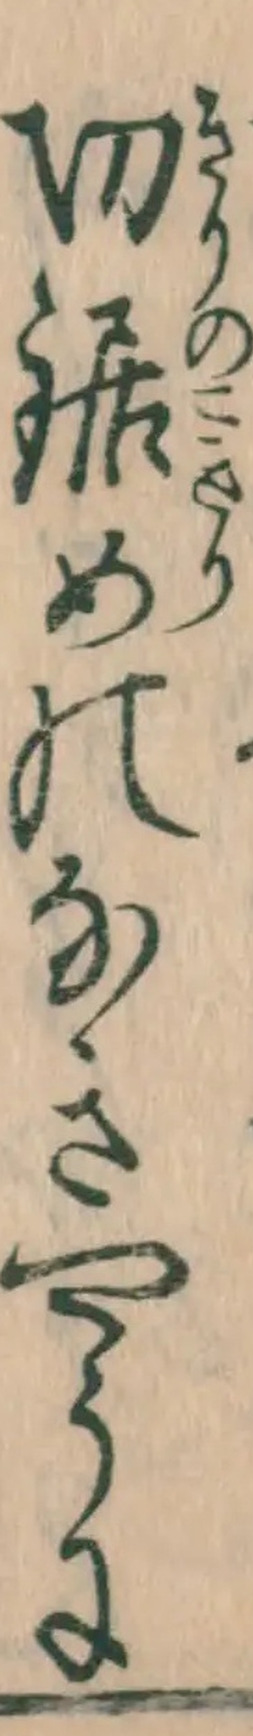切鋸めのなきやうに
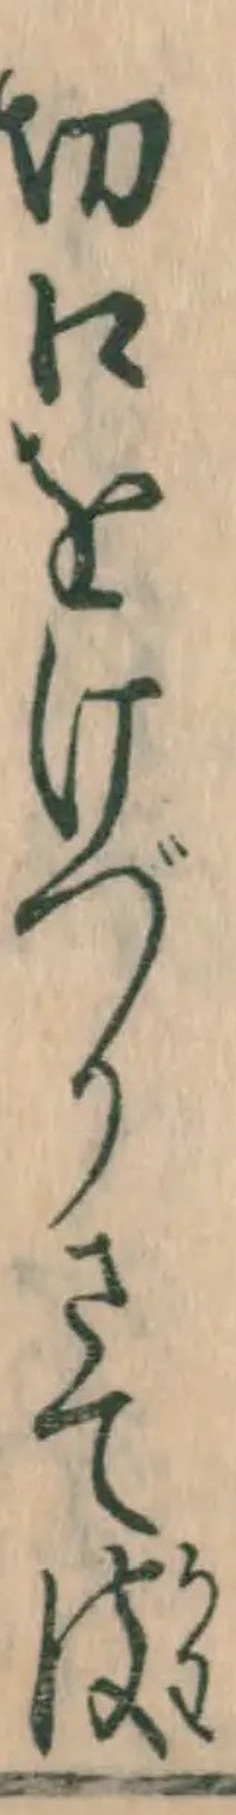切口をけづりさて皮
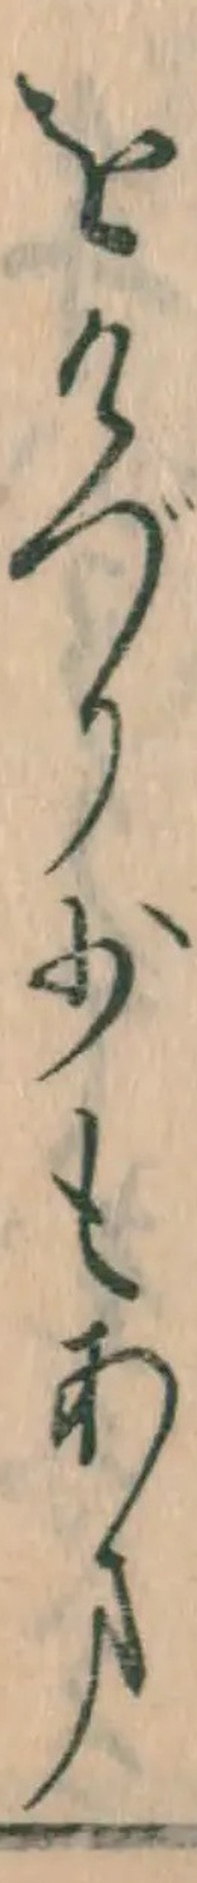をけづり少もあま
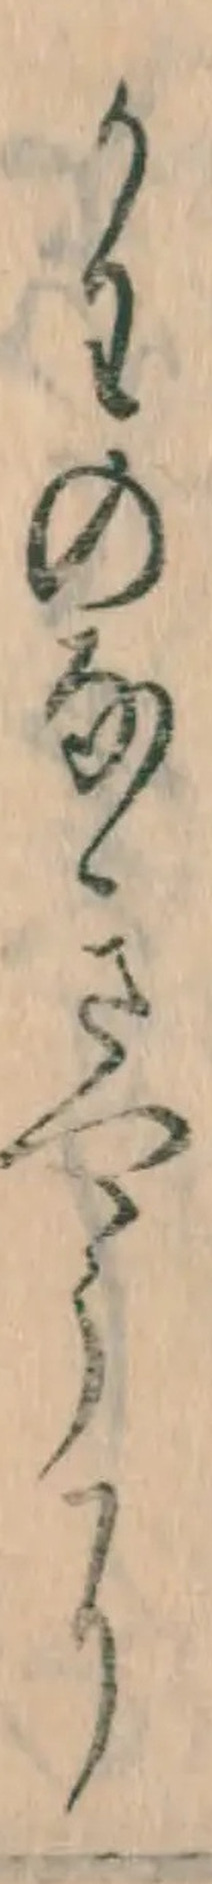かわのなきやうに
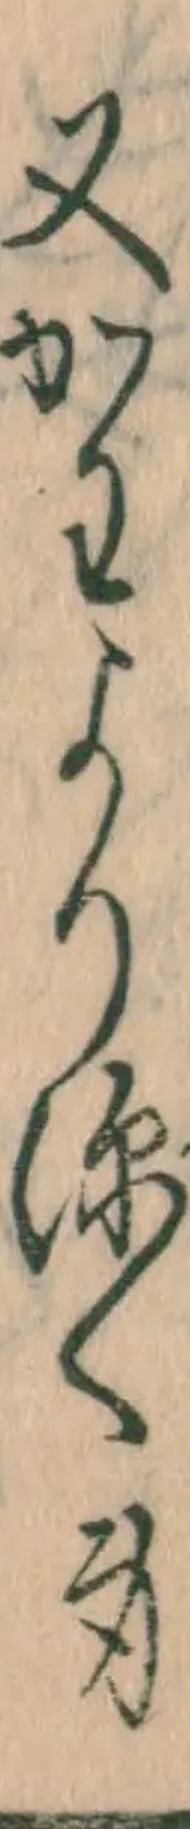又かわより深く身
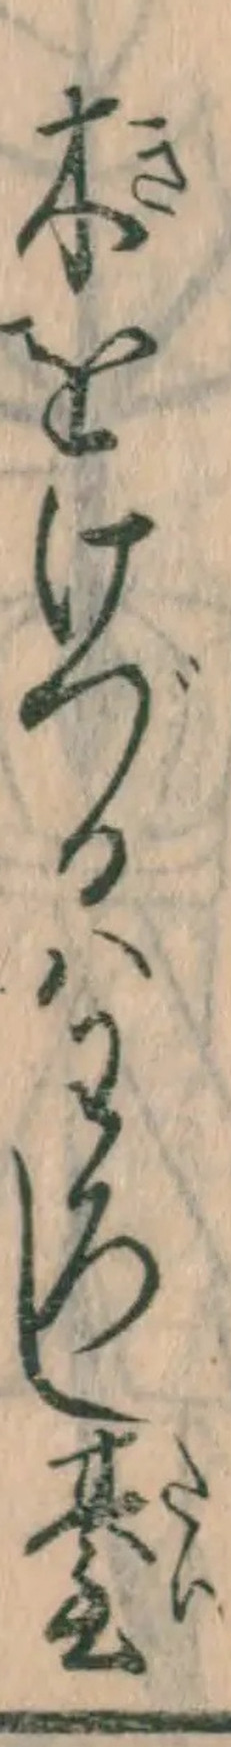木をけづるはわろし䑓
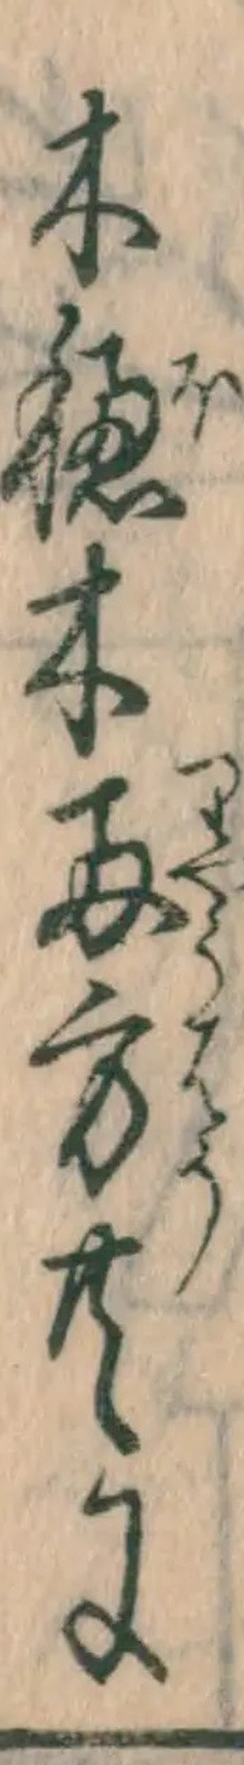木穂木両方共に
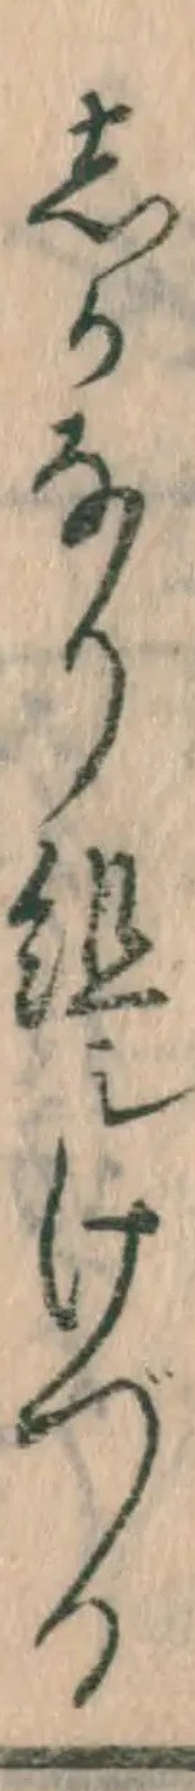しかなり組
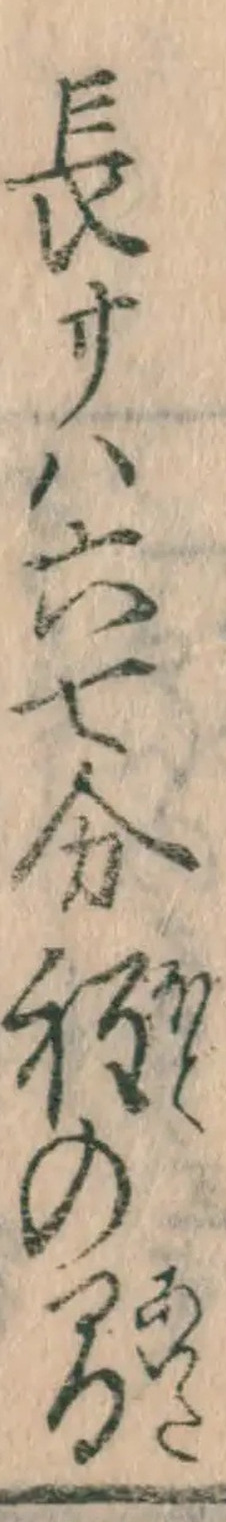長さは六七分程の間
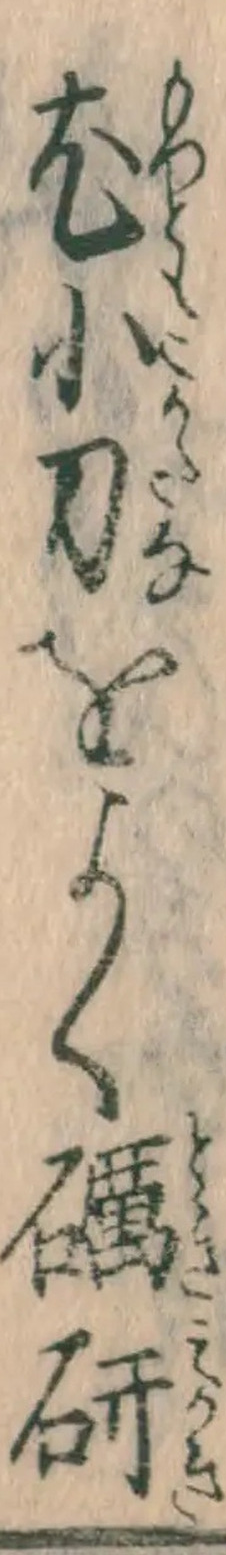尤小刀をよく礪研
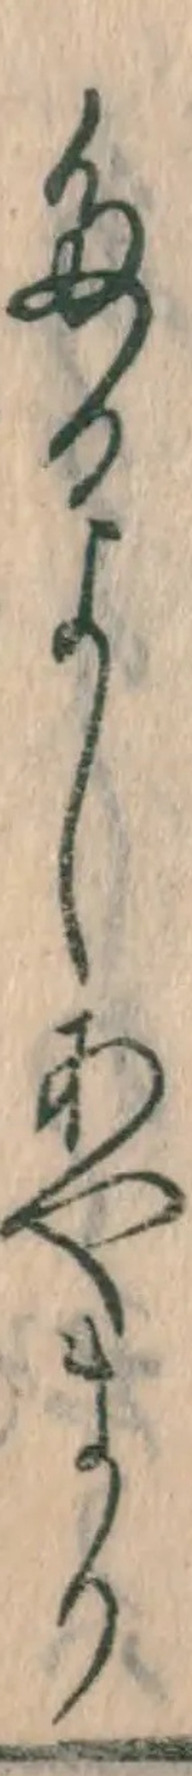たるよしあやまり
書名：錦繍枕 5巻. [5]
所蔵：国立国会図書館 National Diet Library, JAPAN
